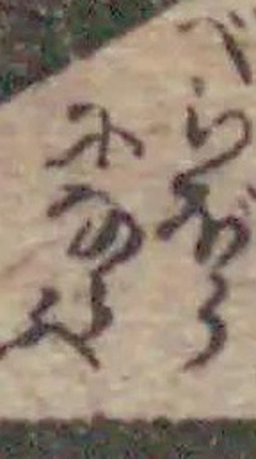にならふ
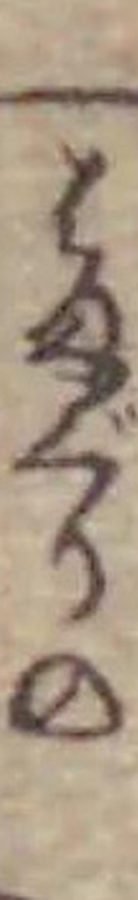はまぐりの
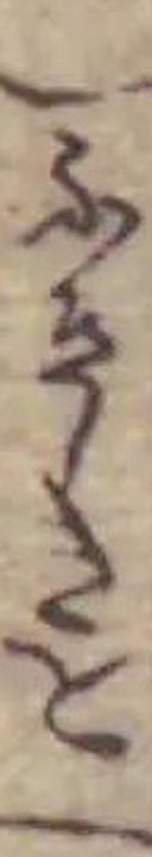ふきしきを
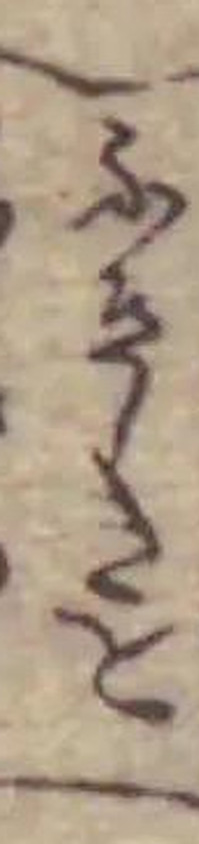ふきしきを
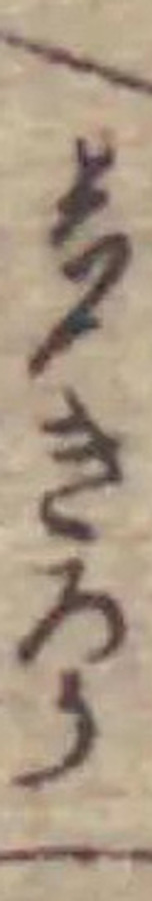しんきろう
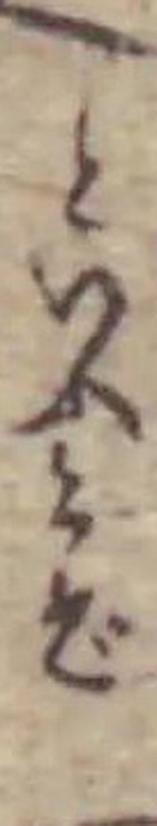といふとぞ
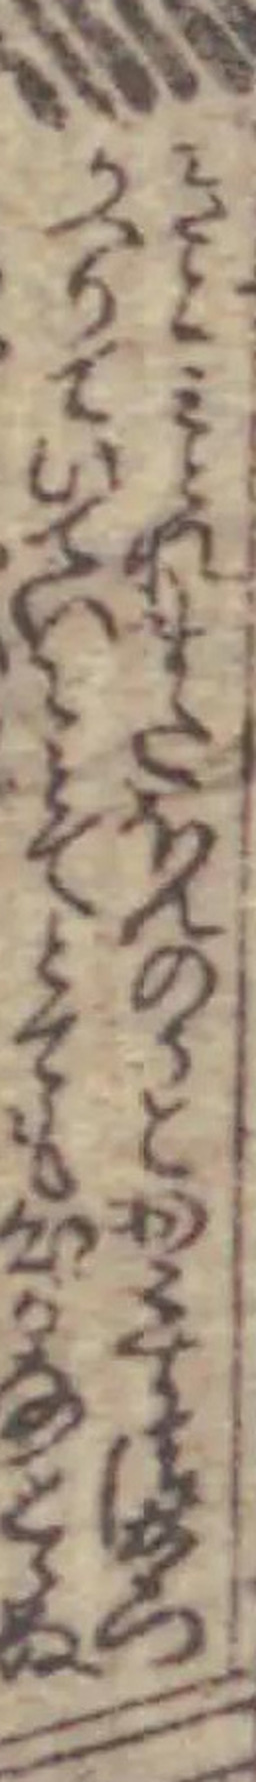かへりて此ていみてとても心がなをらぬ
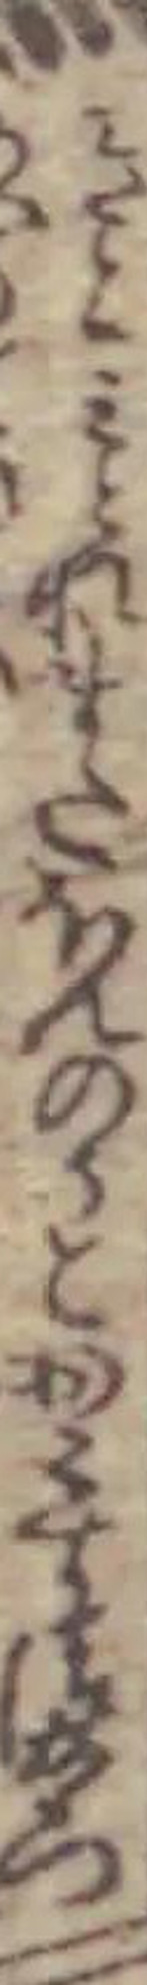きとみとれまたほんのうをおこす清右エ門
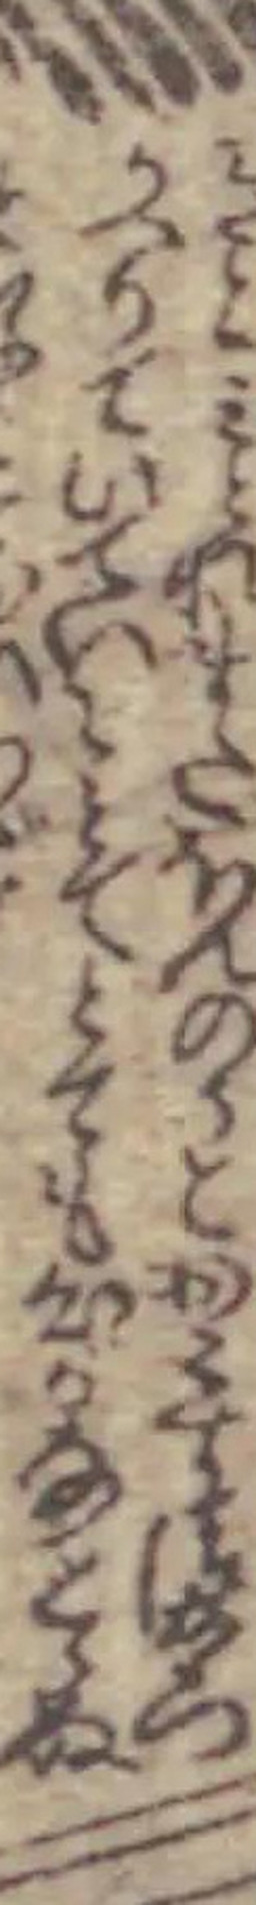かへりて此ていみてとても心がなをらぬ
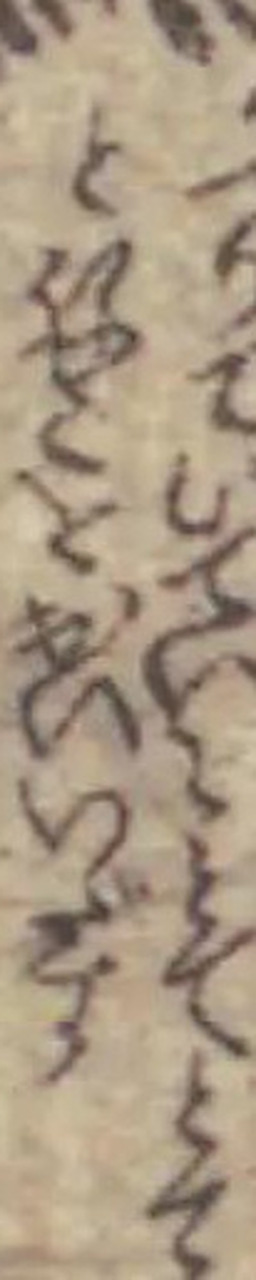とねこをおいいだす
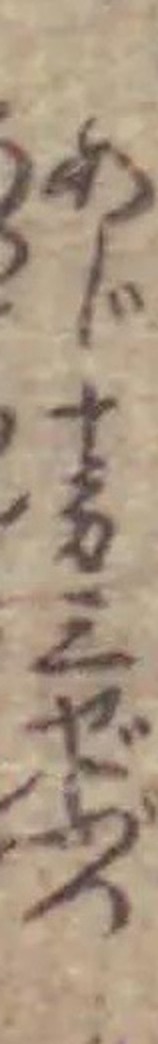あじ十方三ぜぶつ
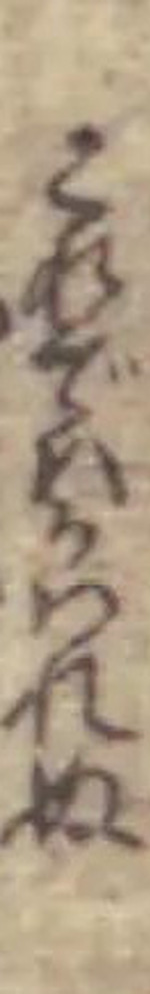これではかはれぬ
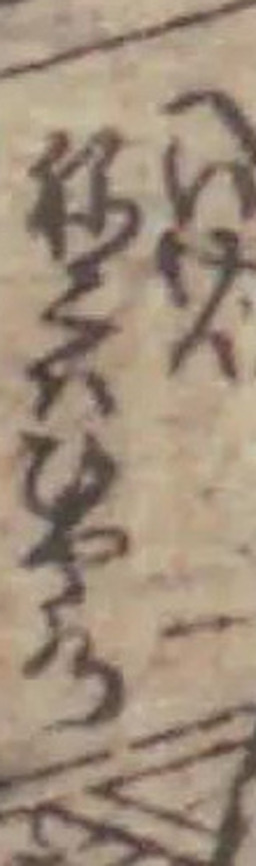ねこはひや水
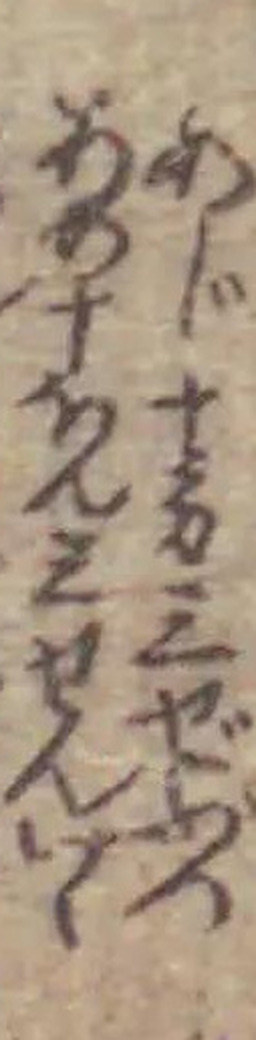あめ十ほん三せんづゝ
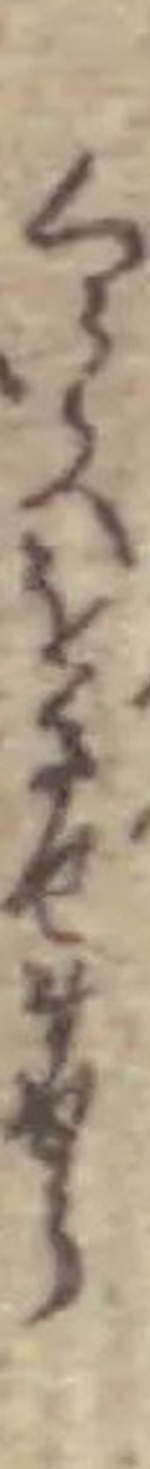くらかへをさせませう
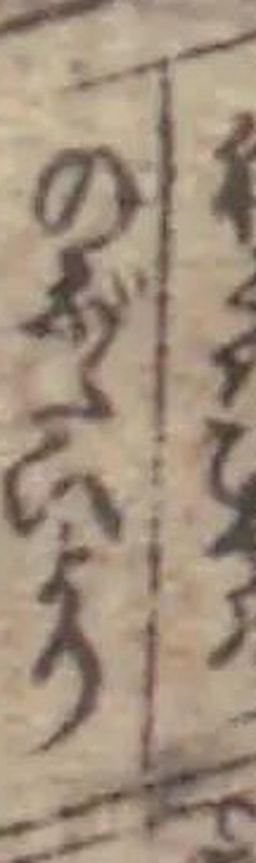のぶたいより
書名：冷水灰毛猫 2巻
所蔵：国立国会図書館 National Diet Library, JAPAN
